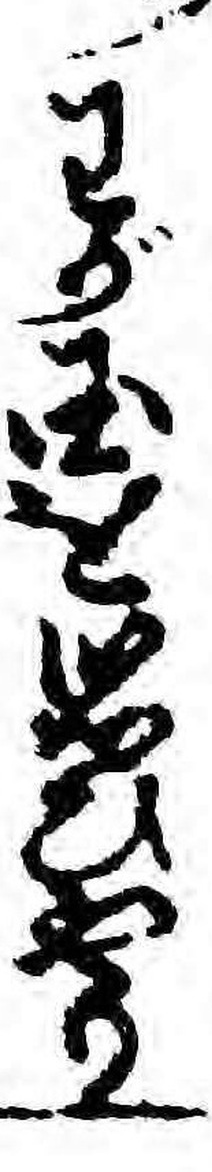わが国を思ひやり
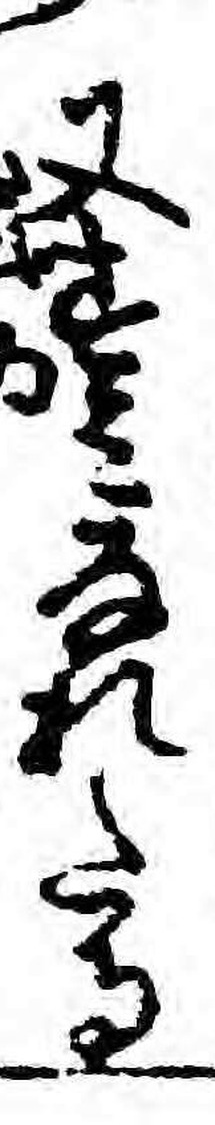又すみなれたる
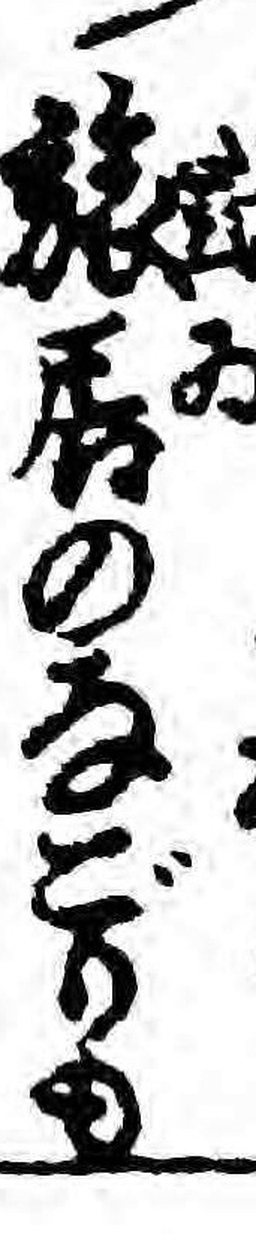旅居のなごりも
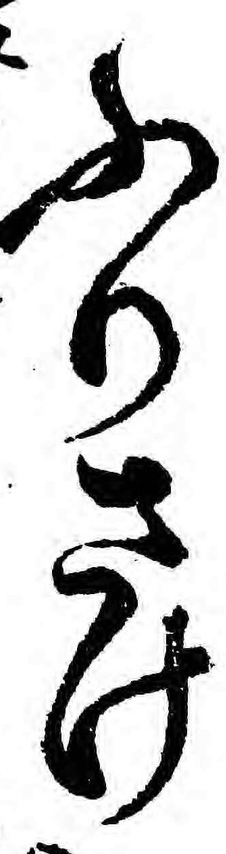ふりさけ
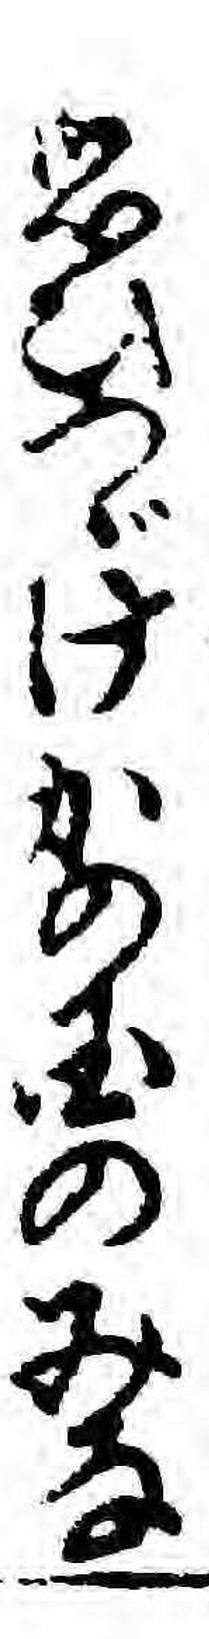思ひつゞけかの国のみな
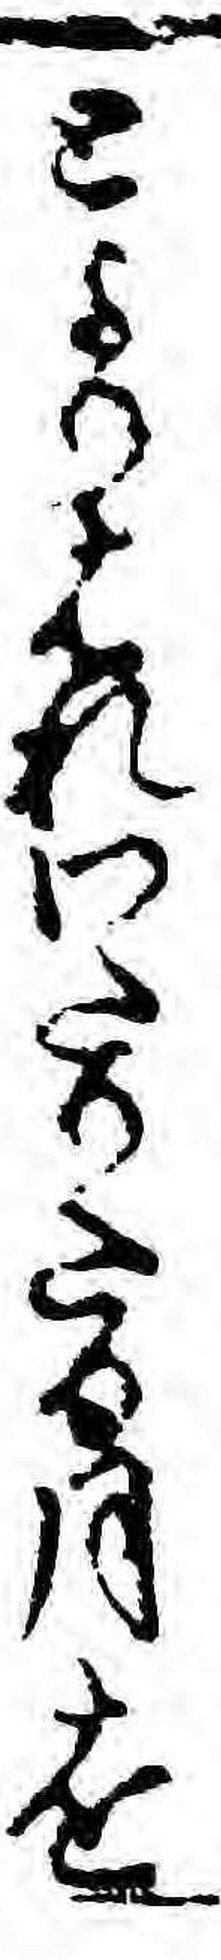とよりはれわたりたる月を
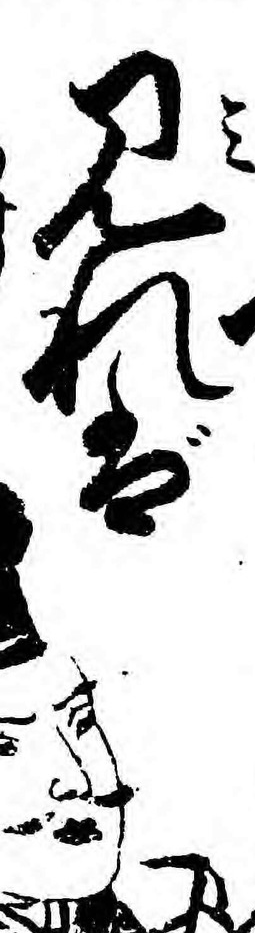見れば
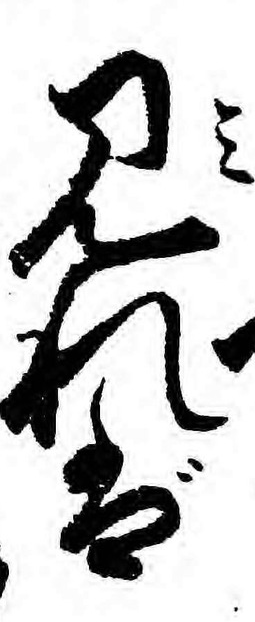見れば
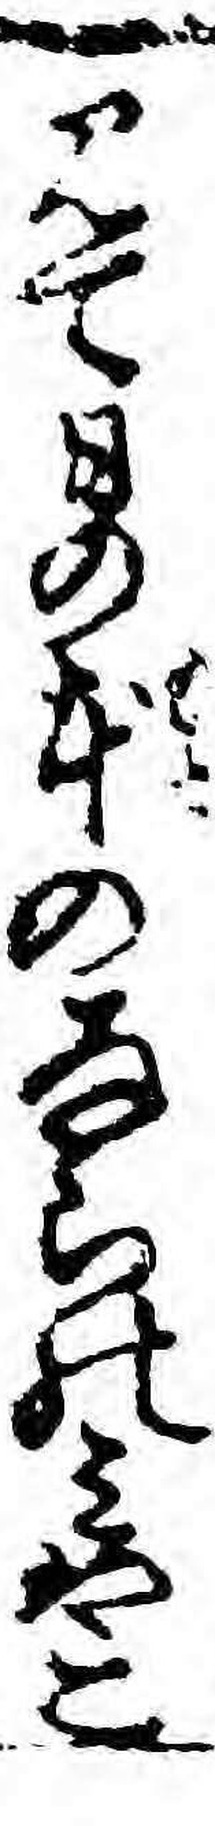見て日の本のならのみやこ
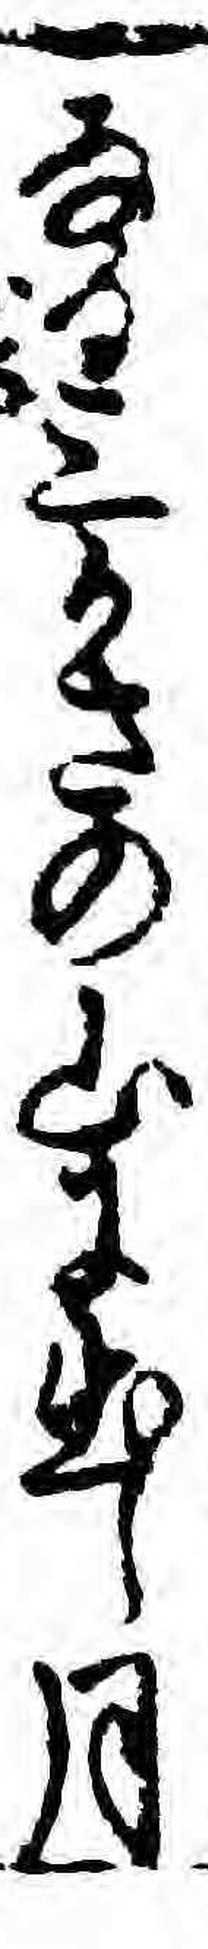なる三かさの山に出し月
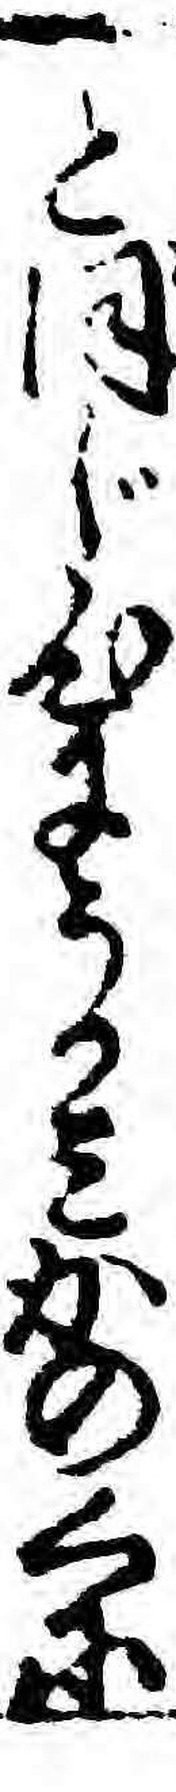と同じ心にうかみかのくに
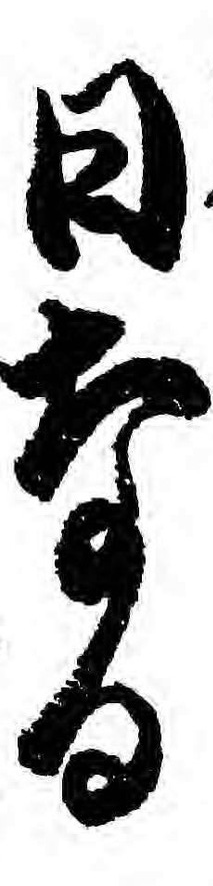日なる
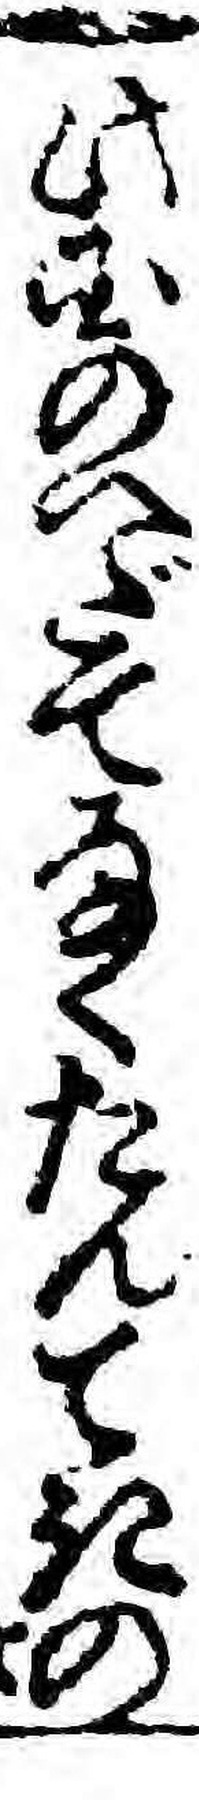此国のへだてなくたんてきの
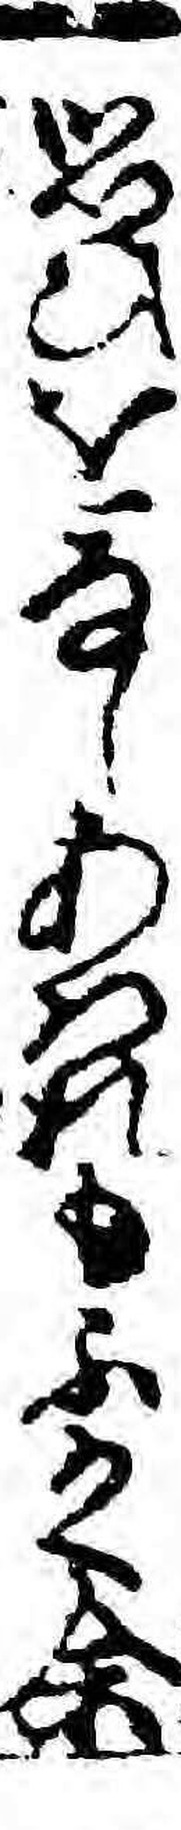思ひをなしあはれもふかく余
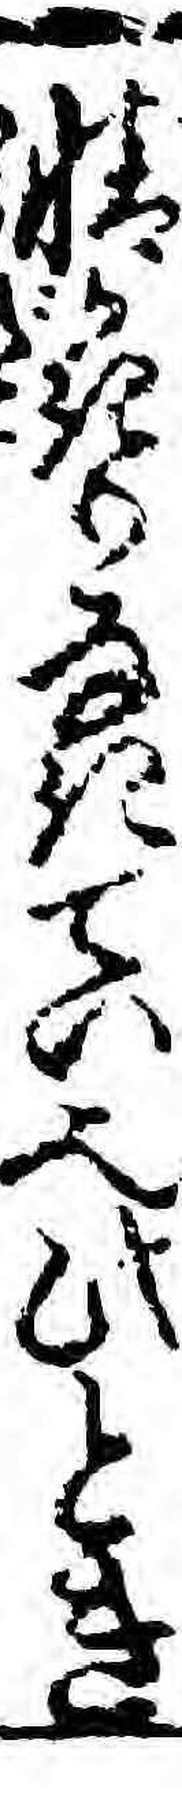情かぎりなきてい也此とき
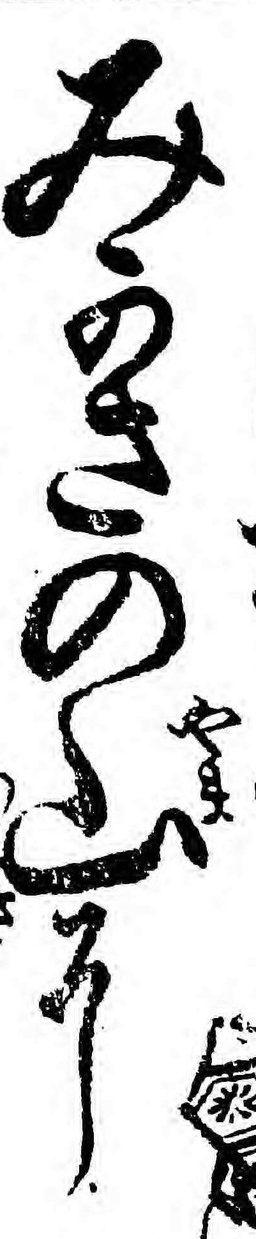みかさの山に
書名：頭書和歌注譯／壽賀多百人一首小倉錦
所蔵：国文学研究資料館
